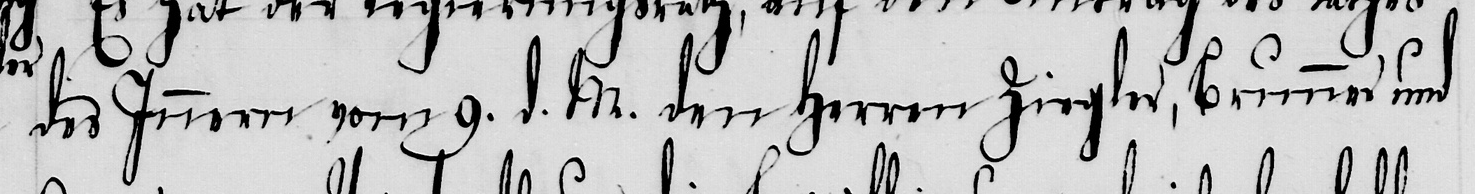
des Innern vom 9. d. M. den Herren Ziegler, Brunner und
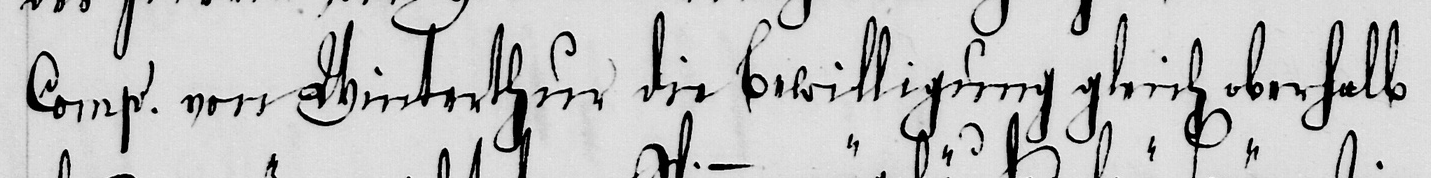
Comp. von Winterthur die Bewilligung gleich oberhalb
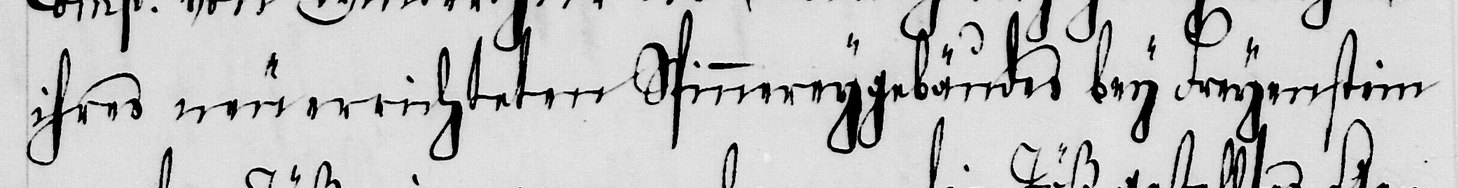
ihres neu errichteten Spinnereygebäudes bey Freyenstein
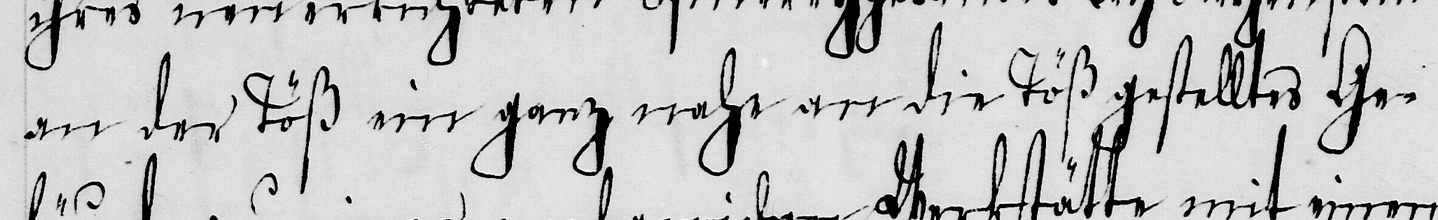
an der Töß ein ganz nahe an die Töß gestelltes Ge¬
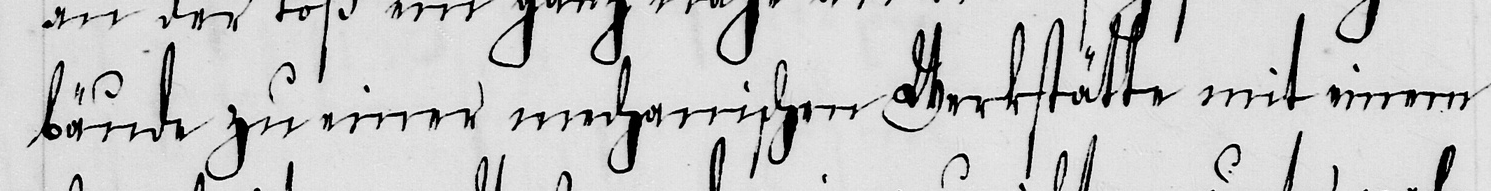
bäude zu einer mechanischen Werkstätte mit einem
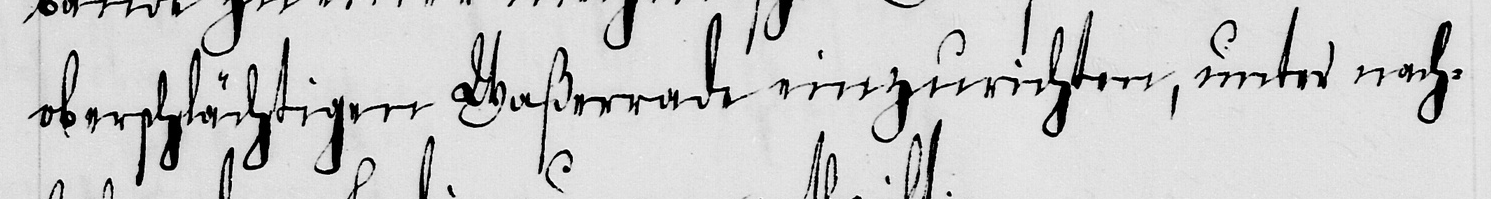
oberschlächtigen Waßerrade einzurichten, unter nach¬
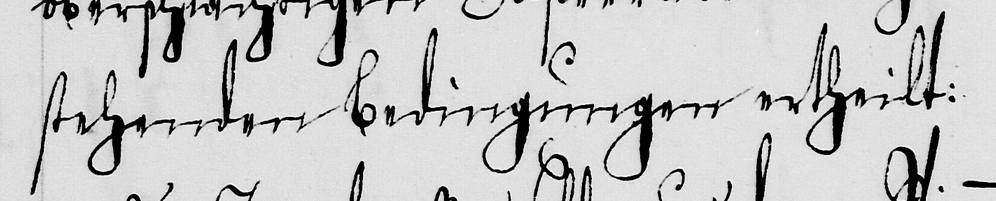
stehenden Bedingungen erhteilt:
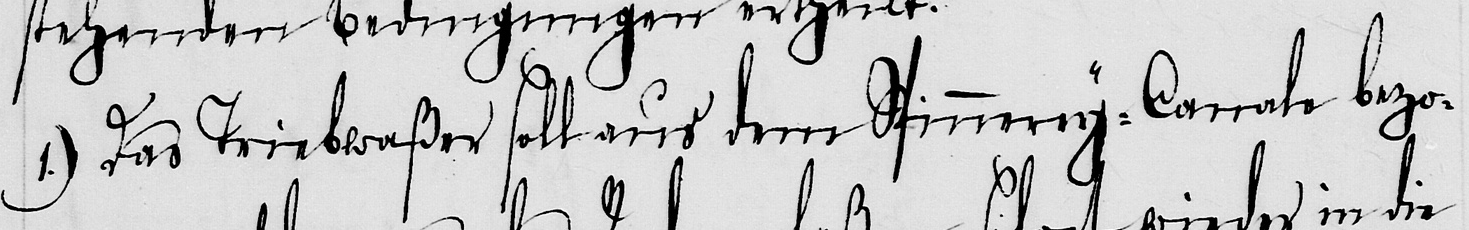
1.) Das Triebwaßer soll aus dem Spinnerey-Canale bezo¬
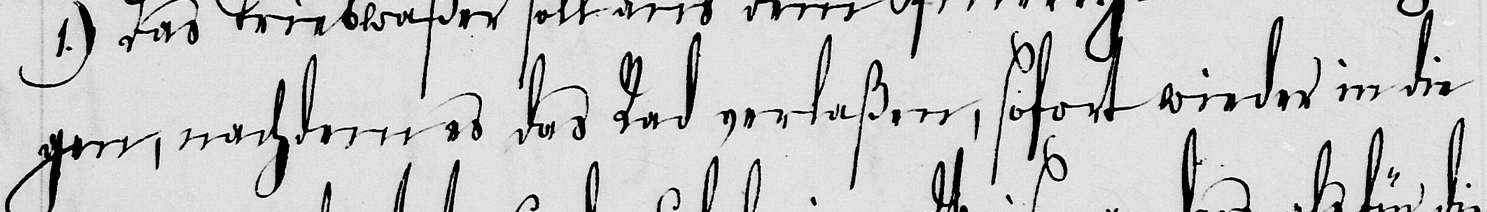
gen, nachdem es das Rad verlaßen, sofort wieder in die
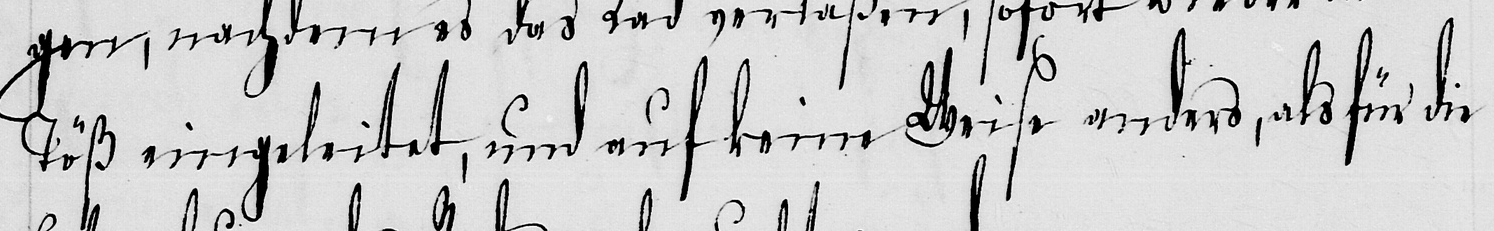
Töß eingeleitet, und auf keine Weise anders, als für d¬
